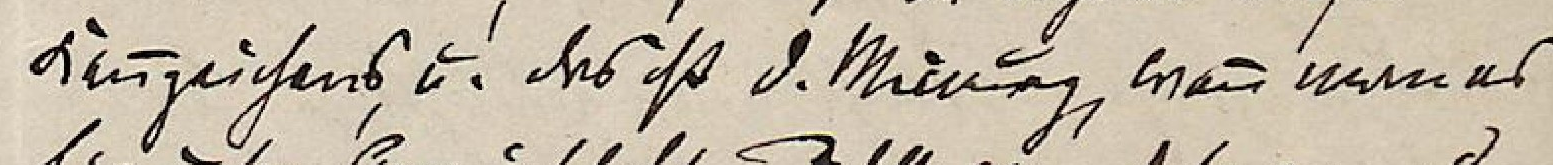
Kenzeichens, u. das ist d. Meinung, wenn man es
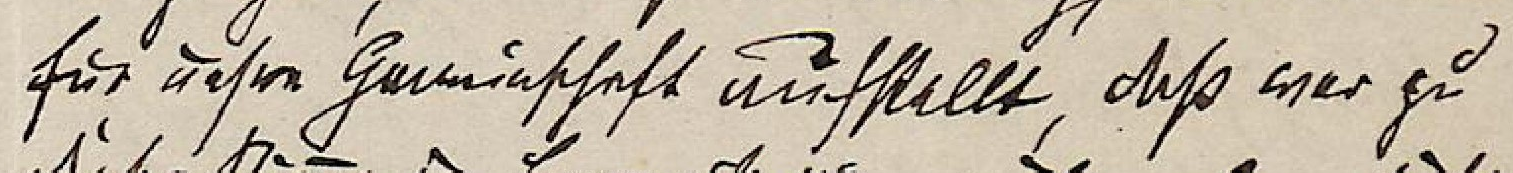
für unsre Gemeinschaft aufstellt, daß wer zu
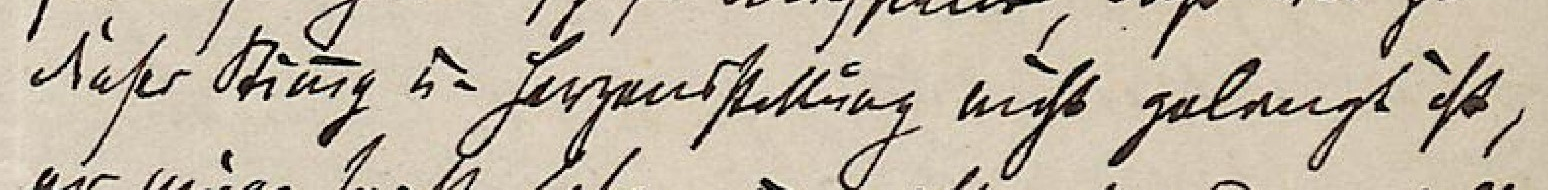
dieser Stimng u. Herzensstellung nicht gelangt ist,
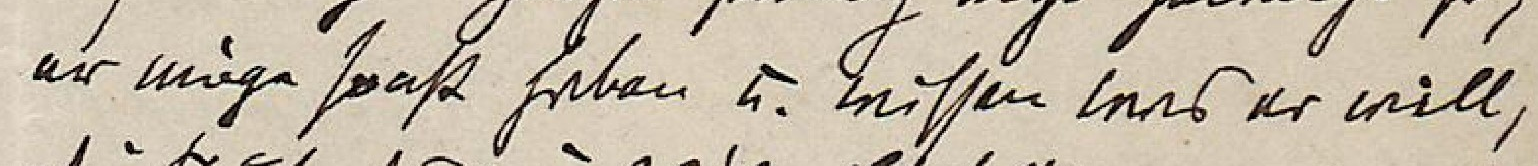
er möge sonst haben u. wissen was er will,
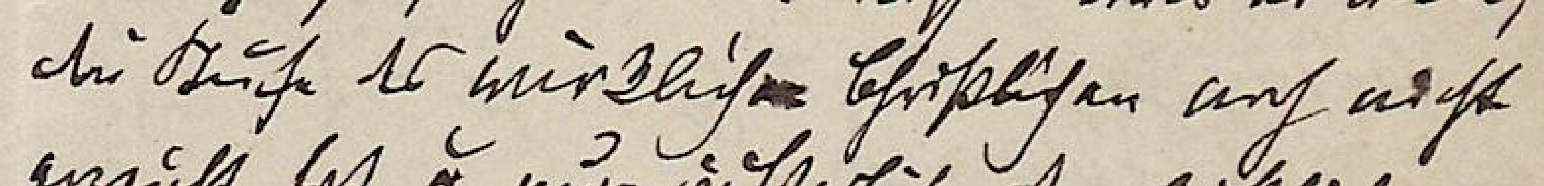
die Stufe des wirklichen Christlichen noch nicht
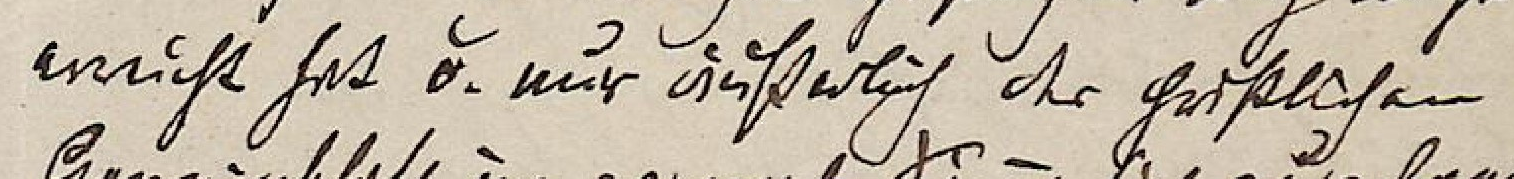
erreicht hat u. nur äußerlich der christlichen
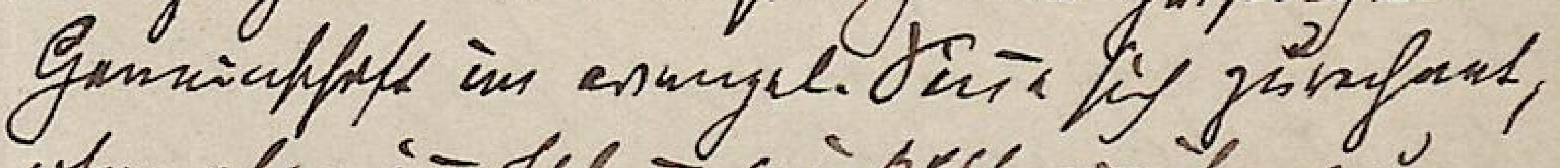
Gemeinschaft in evangel. Sine sich gerechnet
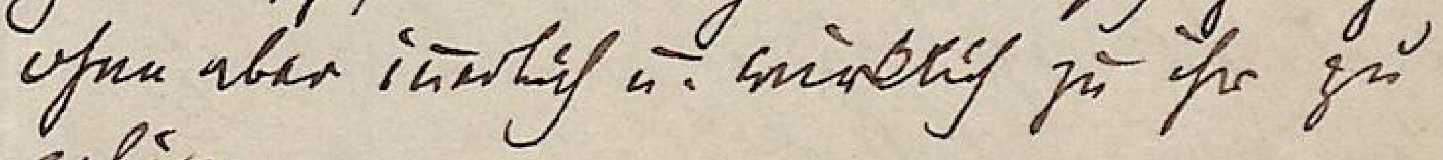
ohne aber innerlich u. wirklich zu ihr zu
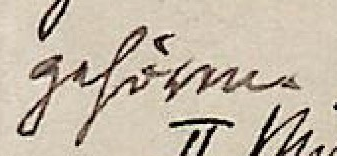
gehören.
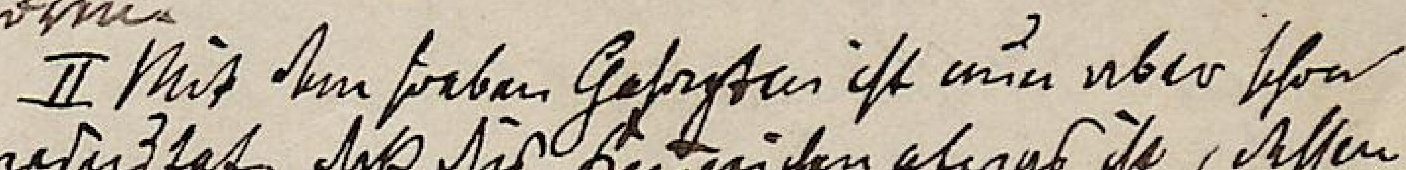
II Mit dem soeben Gesagten ist nun aber schon
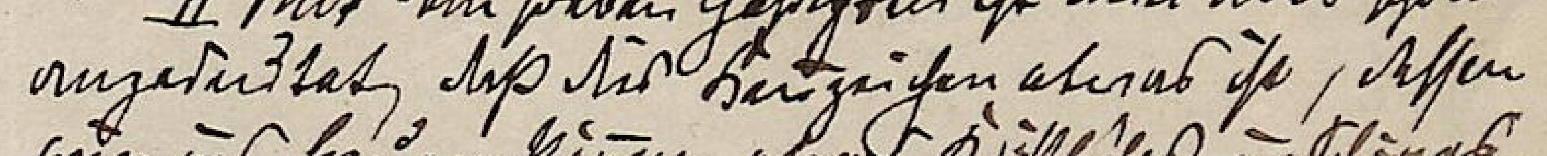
angedeutet, daß dies Kenzeichen etwas ist, dessen
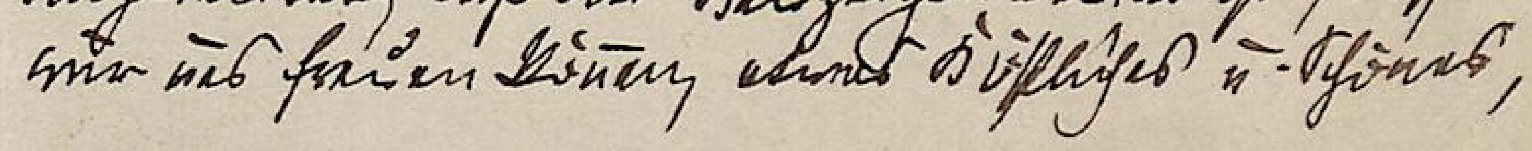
wir uns freuen kömen, was Kösliches u. Schönes
